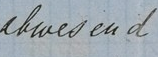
abwesend
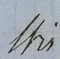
den
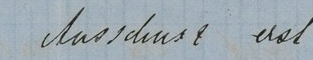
Ausschuss erst
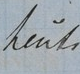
heute
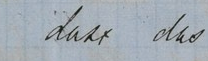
dass das
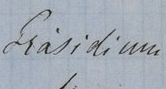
sofort sich an unsere
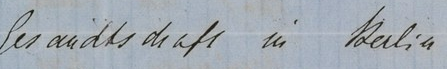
Gesandtschaft in Berlin
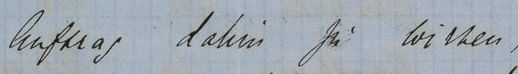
Auftrag dahin zu wirken,
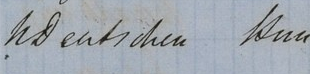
NDeutschen Bun-
